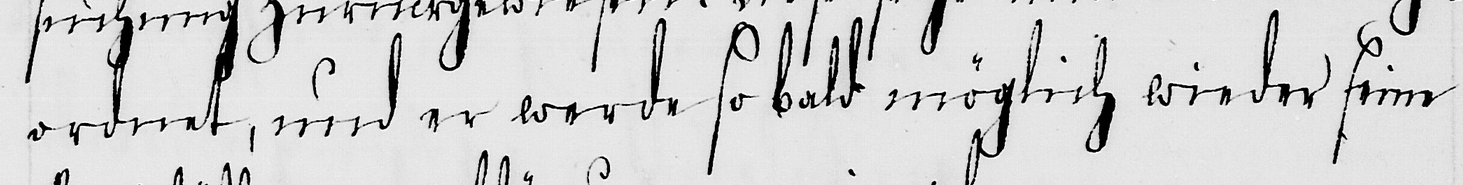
ordnet, und er werde so bald möglich wieder seine
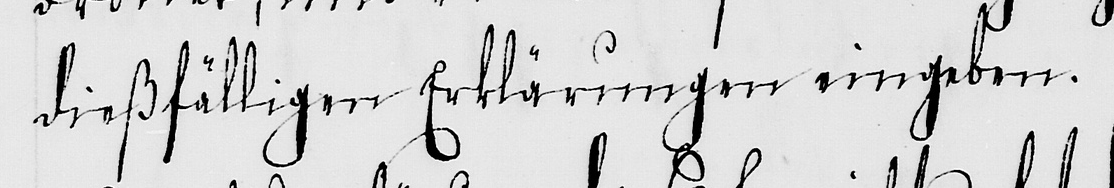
dießfälligen Erklärungen eingeben.
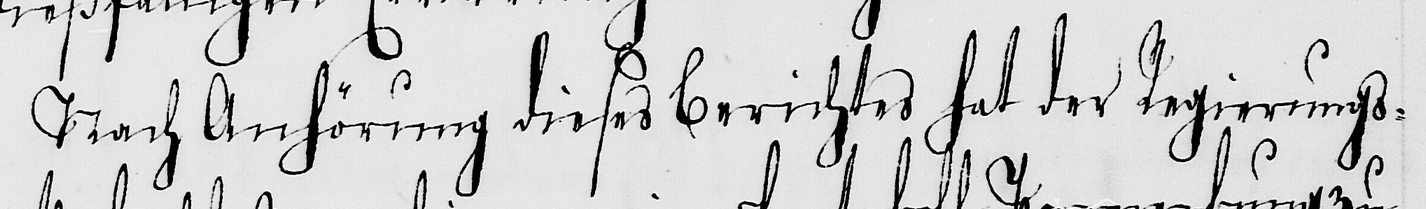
Nach Anhörung dieses Berichtes hat der Regierungs¬
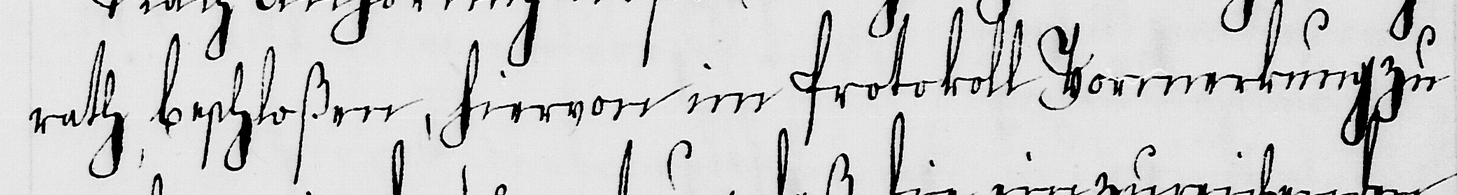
rath beschloßen, hiervon im Protokoll Vormerkung zu
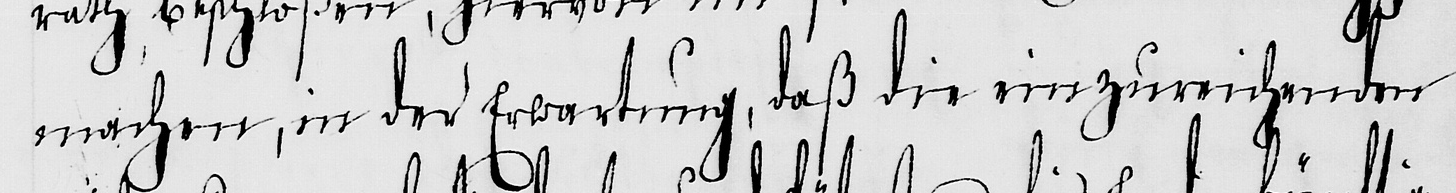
machen, in der Erwartung, daß die einzureichenden
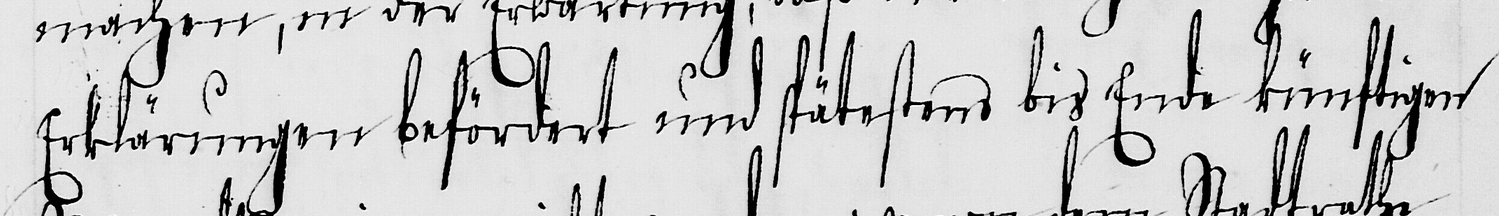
Erklärungen befördert und spätestens bis Ende künftigen
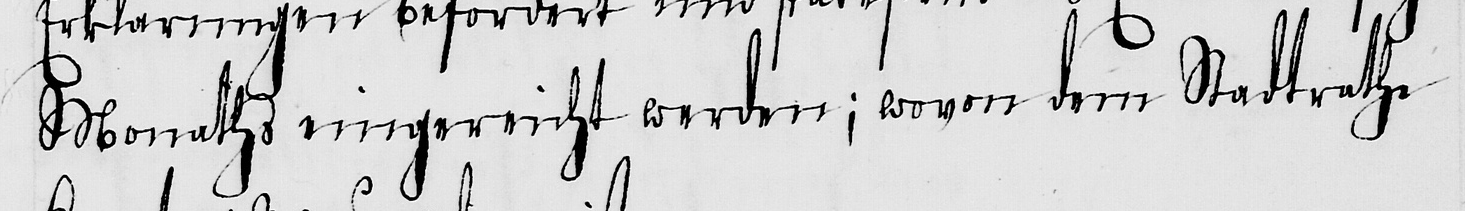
Monaths eingereicht werden; wovon dem Stadtrathe
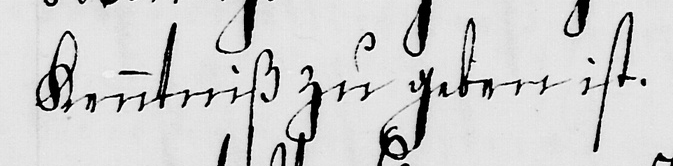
Kenntniß zu geben ist.
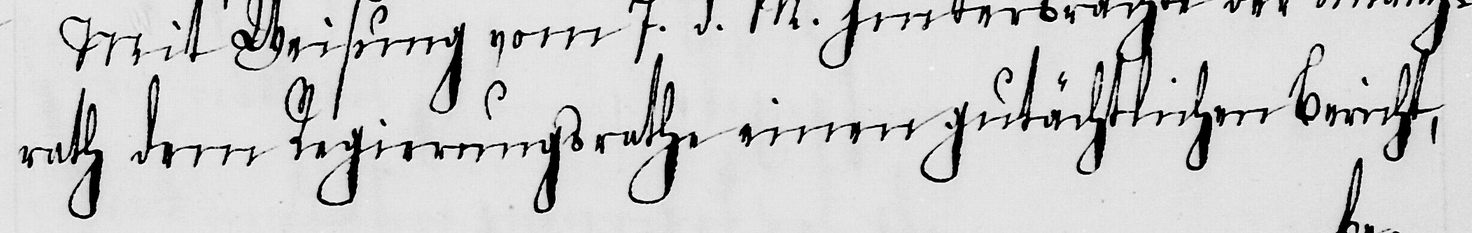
rath dem Regierungsrathe einen gutächtlichen Bericht,
